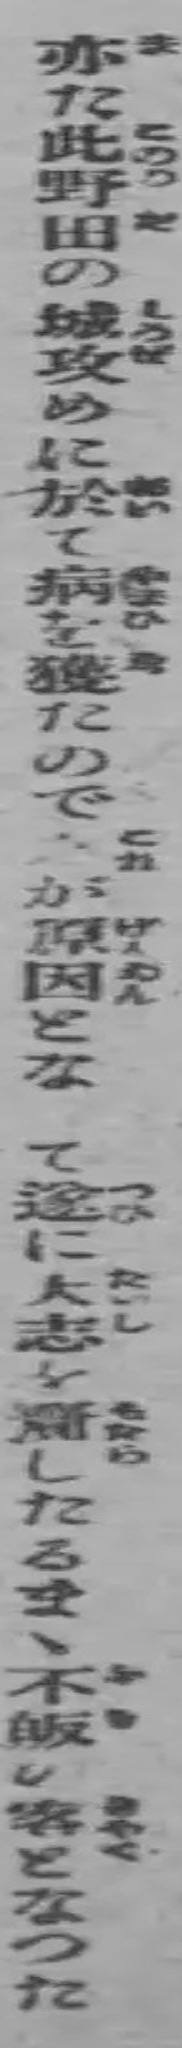亦た此野田の城攻めに於て病を獲たので之が原因となつて遂に大志を齎したるまゝ不皈の客となつた
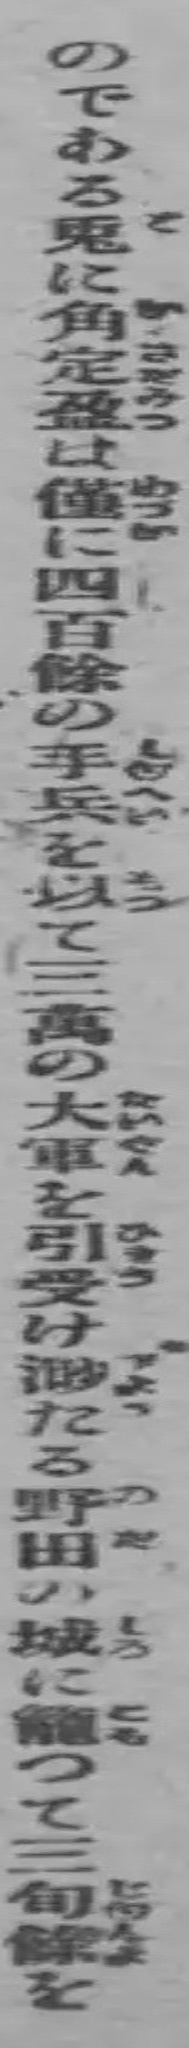のである兎に角定盈は僅に四百余の手兵を以て三万の大軍を引受け渺たる野田の城に籠つて三旬余を
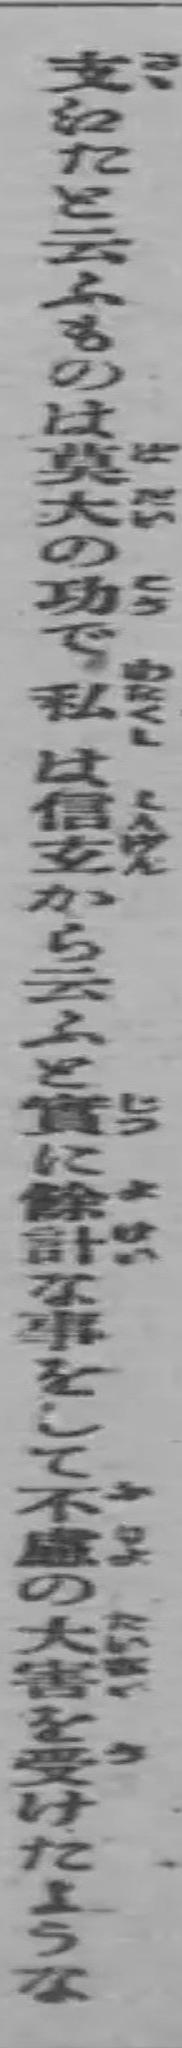支えたと云ふものは莫大の功で私は信玄から云ふと実に余計な事をして不慮の大害を受けたような
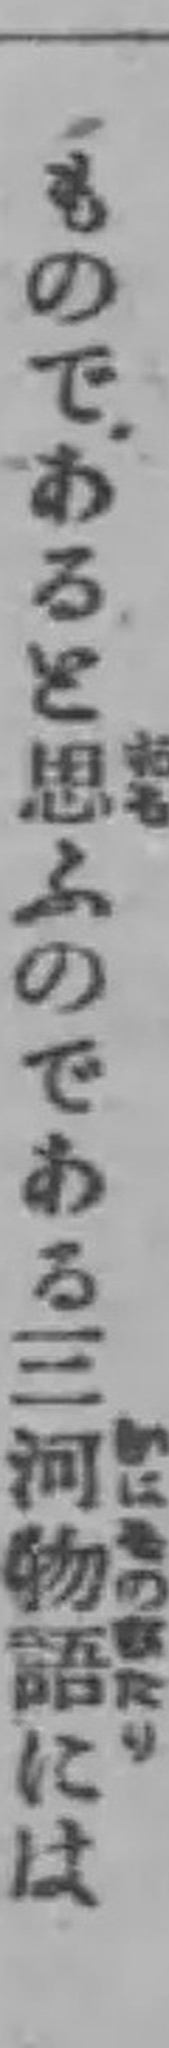ものであると思ふのである三河物語には
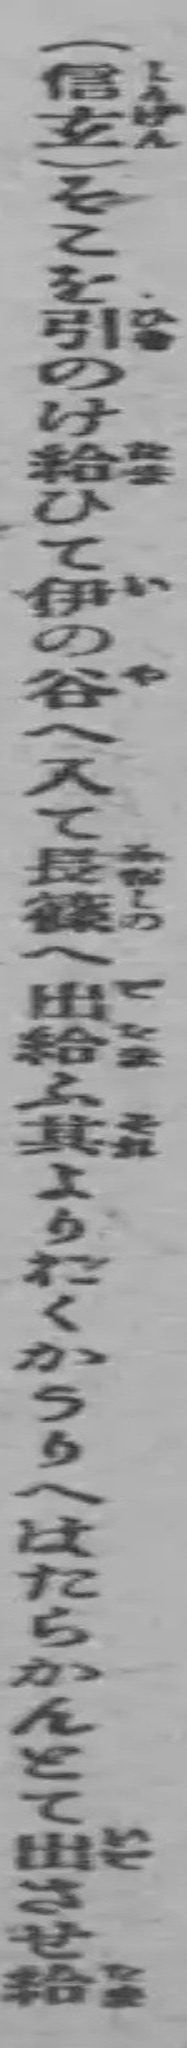(信玄)そこを引のけ給ひて伊の谷へ入て長篠へ出給ふ其よりおくかうりへはたらかんとて出させ給
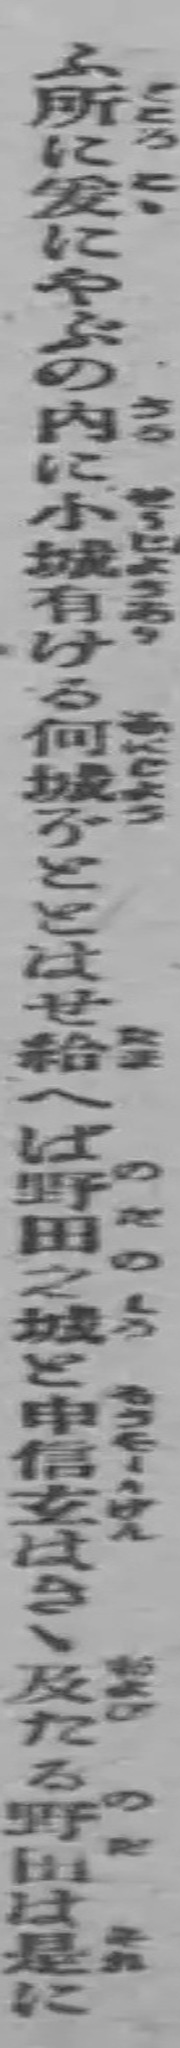ふ所に爰にやぶの内に小城有ける何城ぞととはせ給へば野田之城と申信玄はきゝ及たる野田は是に
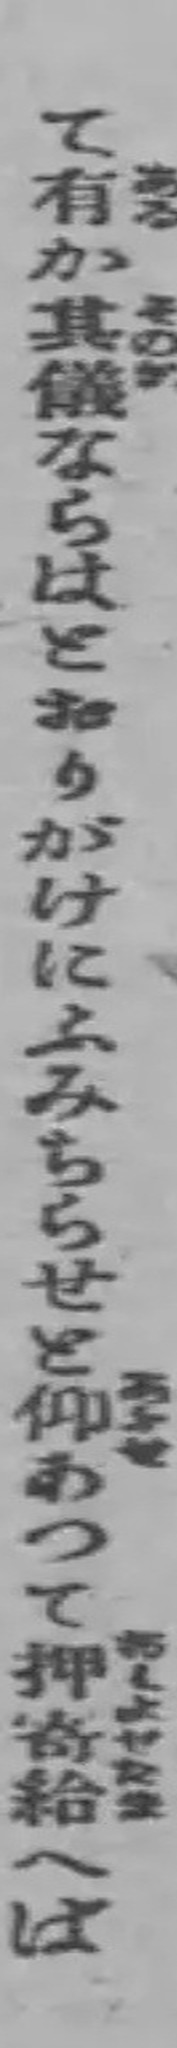て有か其儀ならはとおりがけにふみちらせと仰あつて押寄給へば
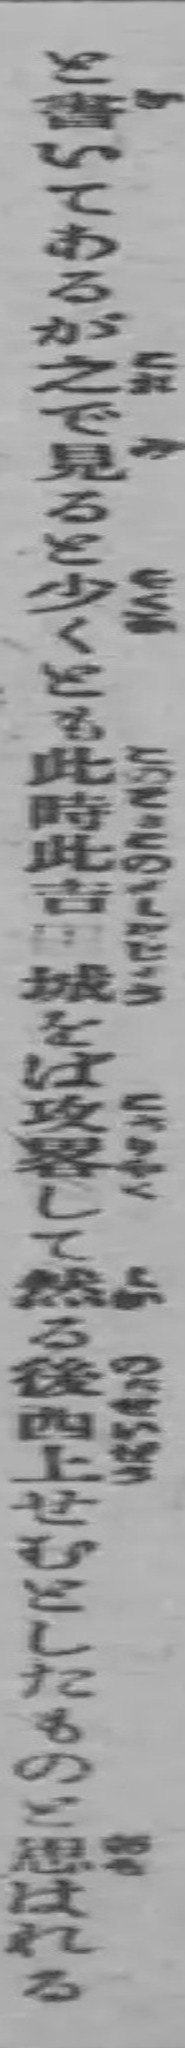と書いてあるが之で見ると少くとも此時此吉田城をば攻略して然る後西上せむとしたものと思はれる
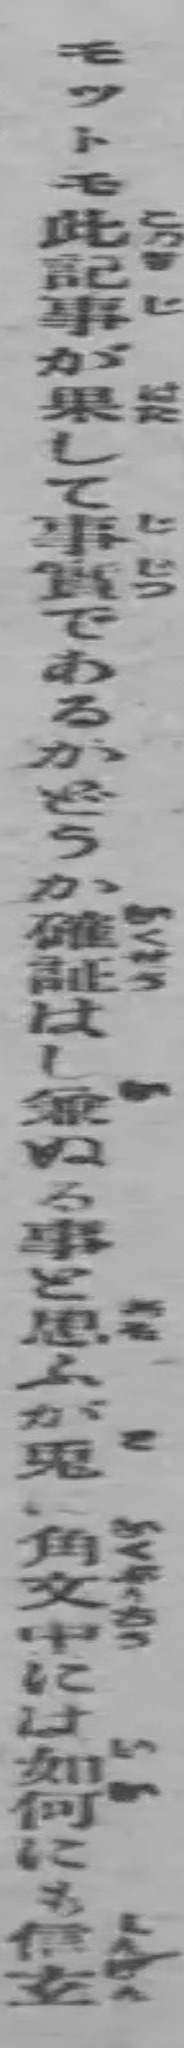モツトモ此記事が果して事実であるかどうか確証はし兼ぬる事と思ふが兎に角文中には如何にも信玄
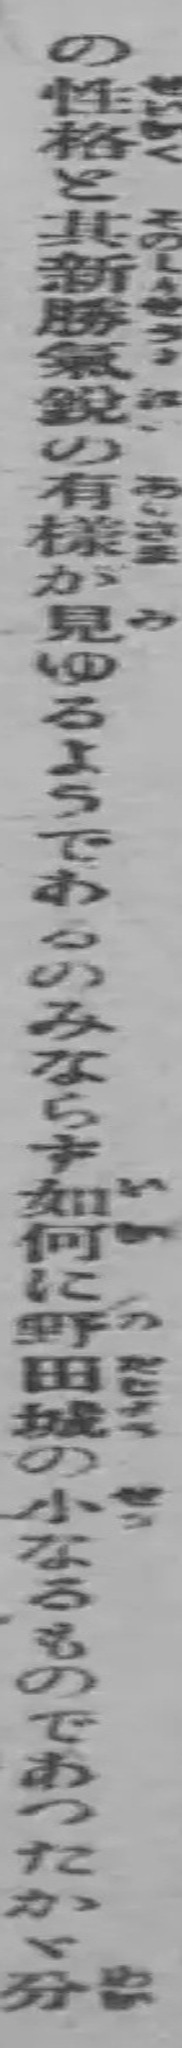の性格と其新勝気鋭の有様が見ゆるようであるのみならず如何に野田城の小なるものであつたかゞ分
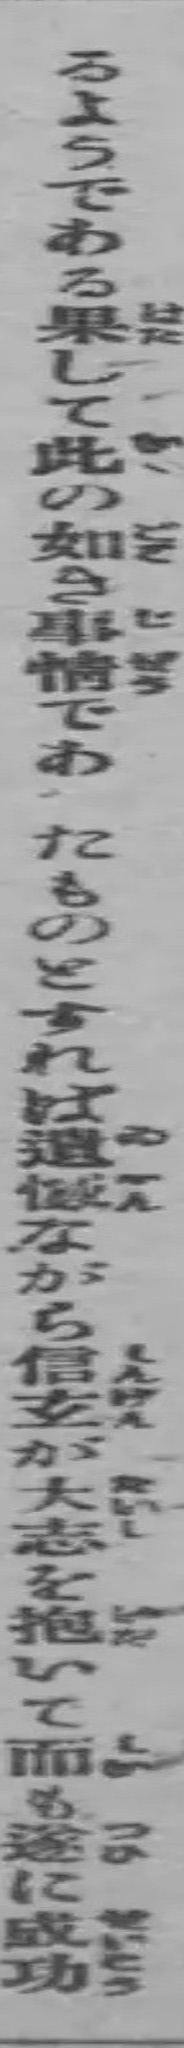信玄の卒去るようである果して此の如き事情であつたものとすれば遺憾ながら信玄が大志を抱いて而も遂に成功
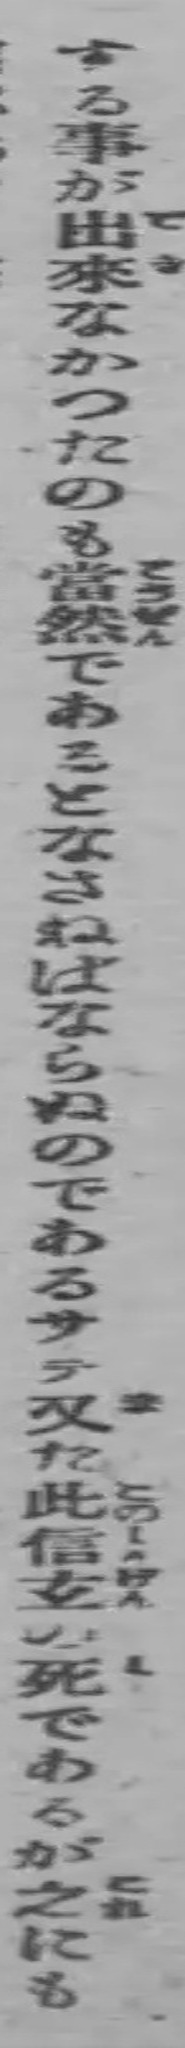する事が出来なかつたのも当然であるとなさねばならぬのであるサテ又た此信玄の死であるが之にも
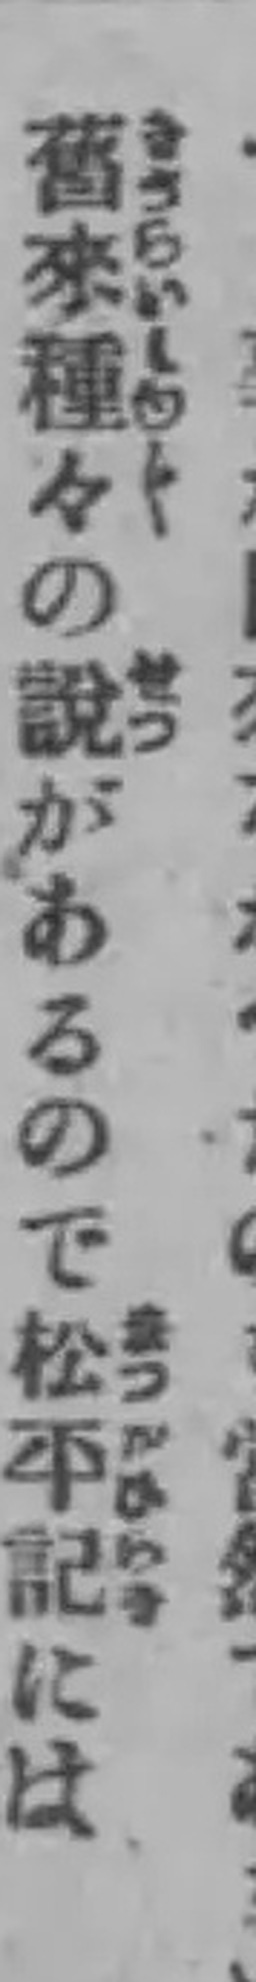旧来種々の説があるので松平記には
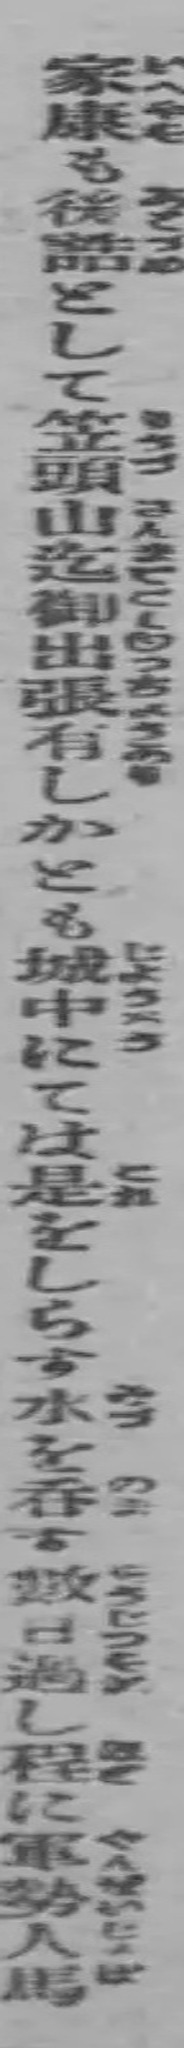家康も後詰として笠頭山迄御出張有しかとも城中にては是をしらす水を呑す数日過し程に軍勢人馬
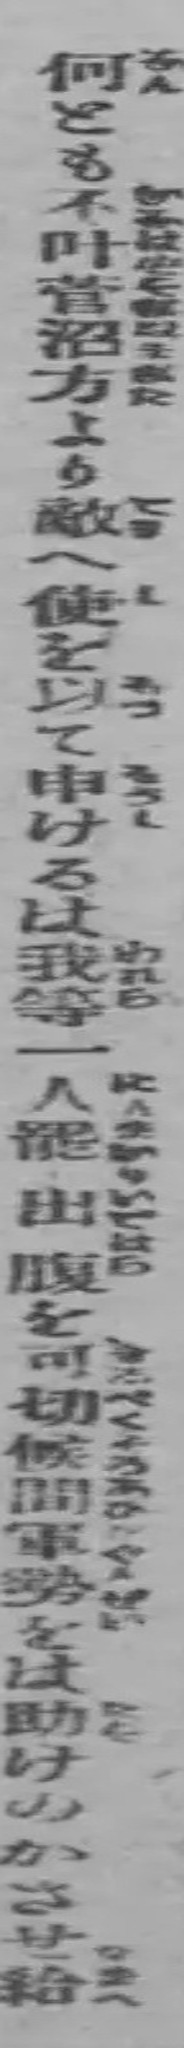何とも不叶菅沼方より敵へ使を以て申けるは我等一人罷出腹を可切候間軍勢をは助けのかさせ給
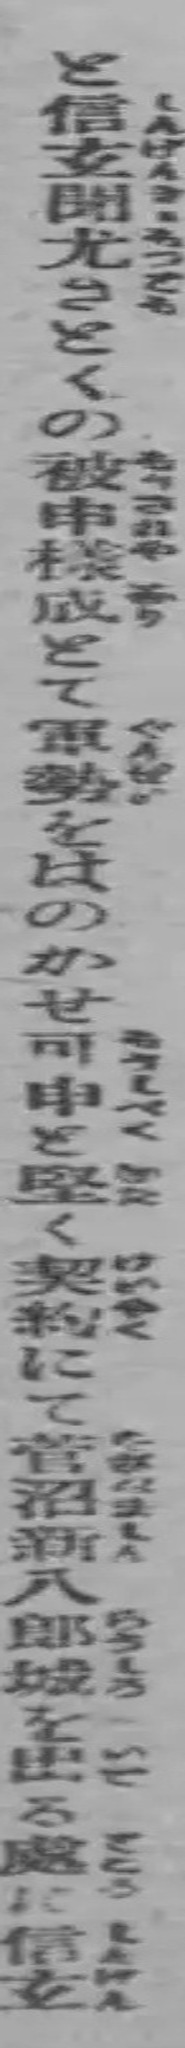と信玄聞尤きとくの被申様成とて軍勢をはのかせ可申と堅く契約にて菅沼新八郎城を出る処に信玄
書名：豊橋市史談
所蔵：国立国会図書館 National Diet Library, JAPAN
